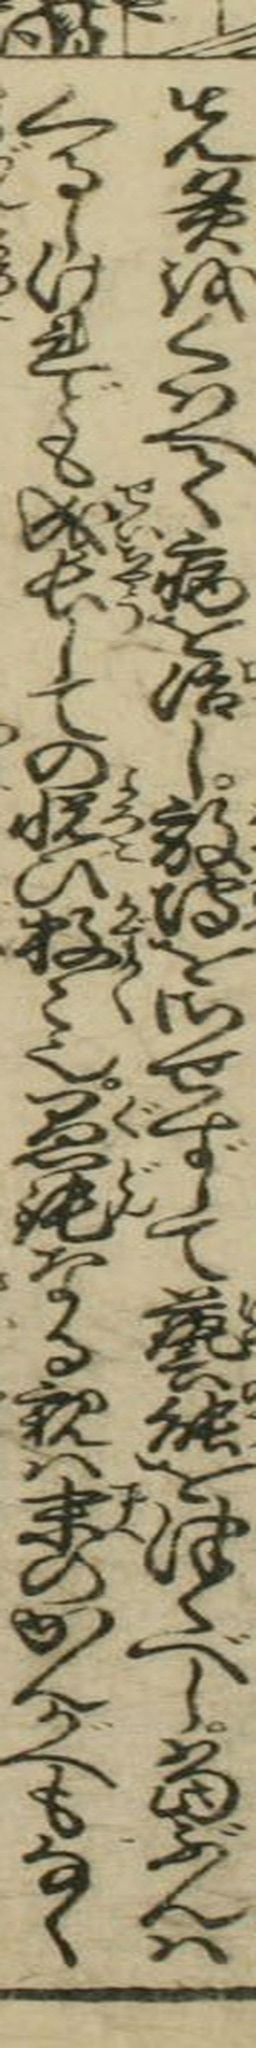くるしけれども成長しての悦び数々なり。愚鈍なる親は末のかんがへもなく
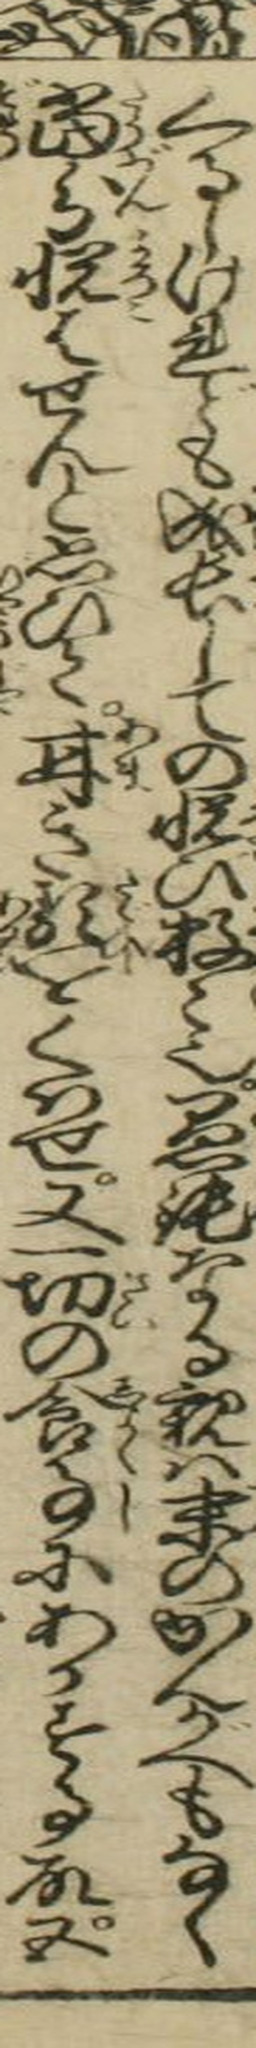當分悦はせんと思ひて。甘き類をくはせ。又一切の食事にあかす事故。五
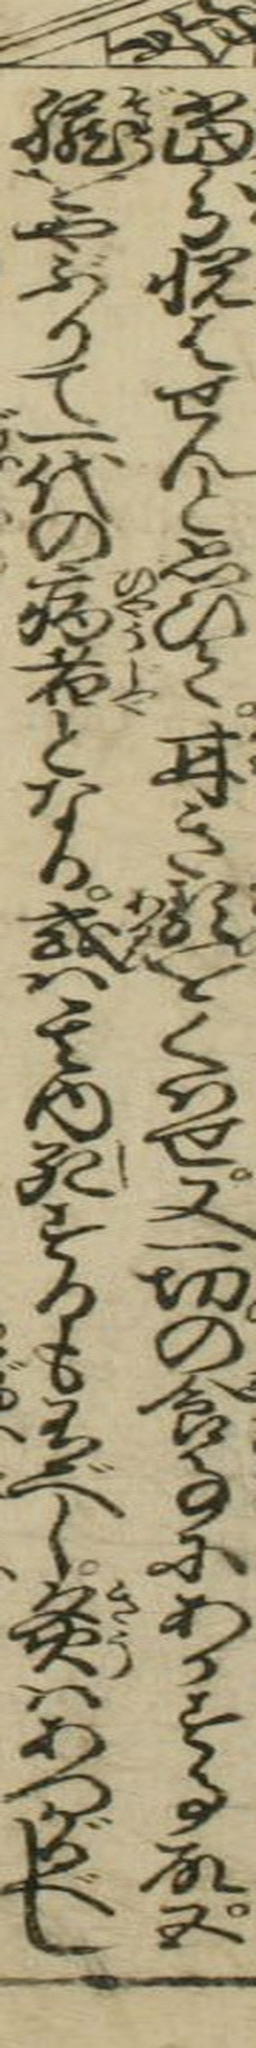臓をやぶりて一代の病者となる。或は其内死するも有べし。灸はあつがるべし
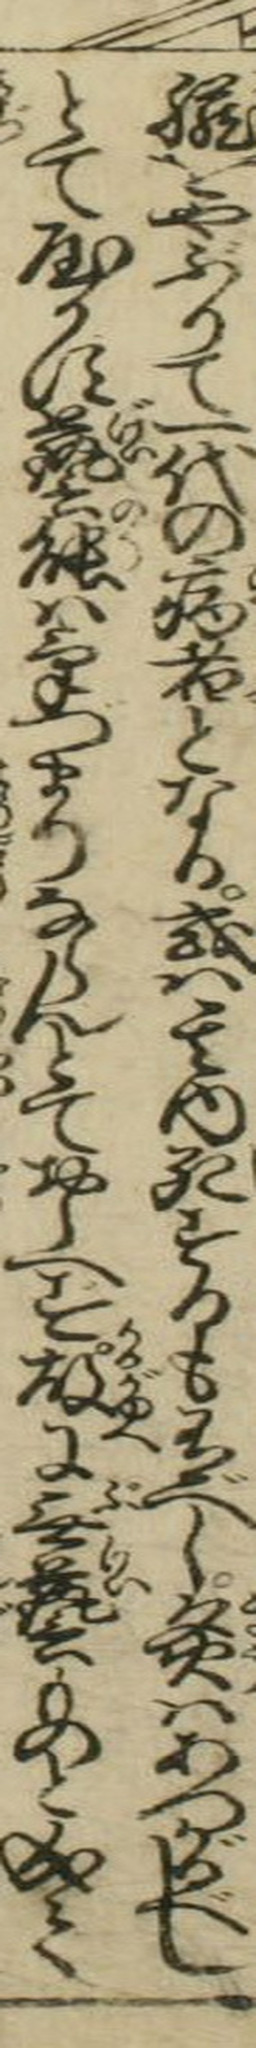とてやかす藝能は氣づまりならんとておしへず。故に無藝ものと成て
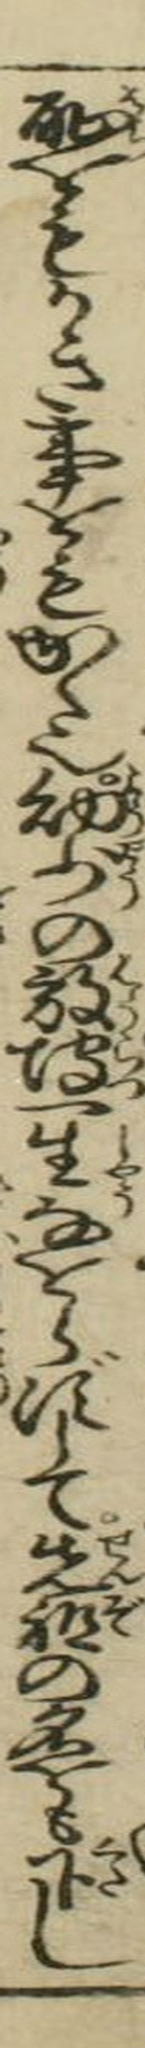恥をもかき事をもかく也。幼少の放埒一生なをらずして。先祖の名をも下し
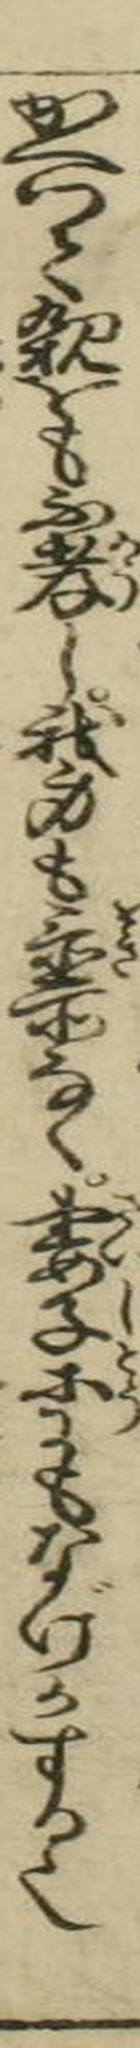かへつて親をも不孝し。我身も置所なく。妻子等にもなげかする也
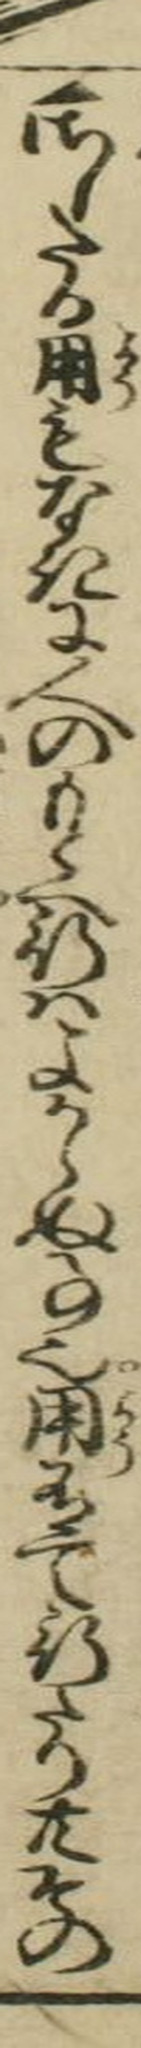▲さしたる用もなきに人のもとへ行はよからぬ事也。用有て行たり共その
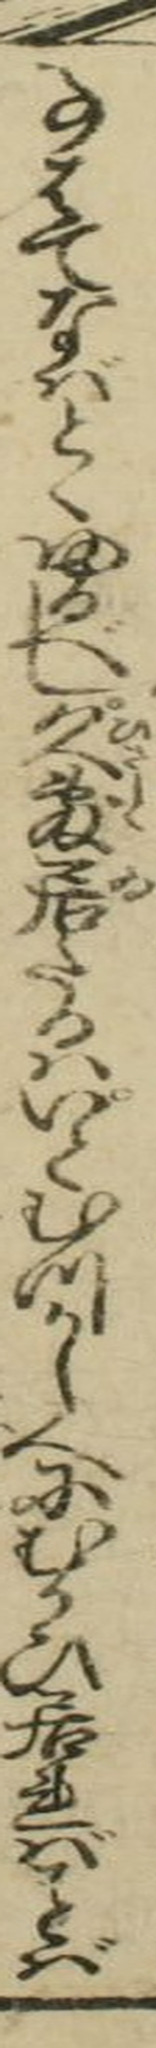事はてなばとく帰るべし。久敷居たるは。いとむつかし人にむかひ居ればことば
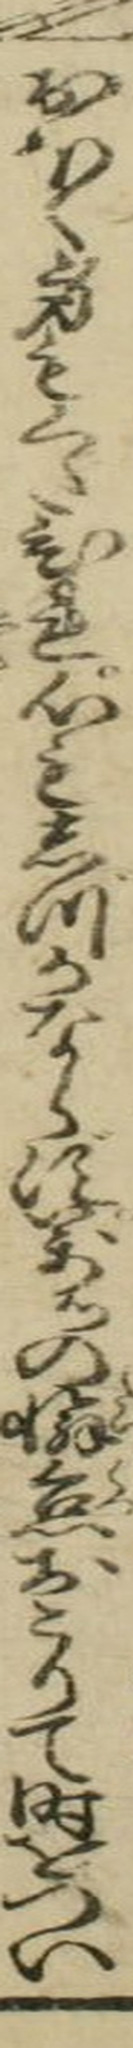おほく身もくたひれ。心もしづかならず。萬つの懈怠おこりて時をつい
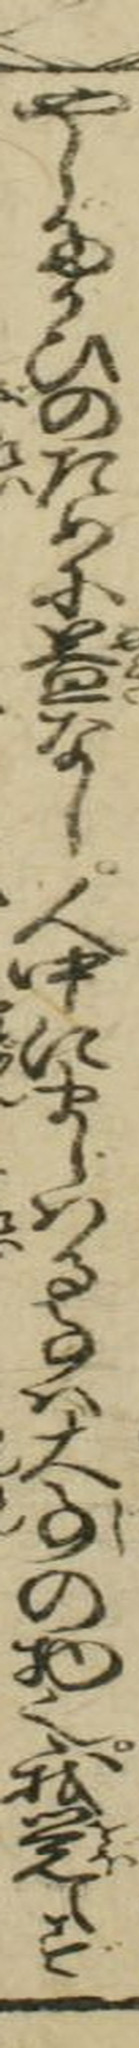やし。たかひのために益なし。人中にまじはる事は大事の物也。
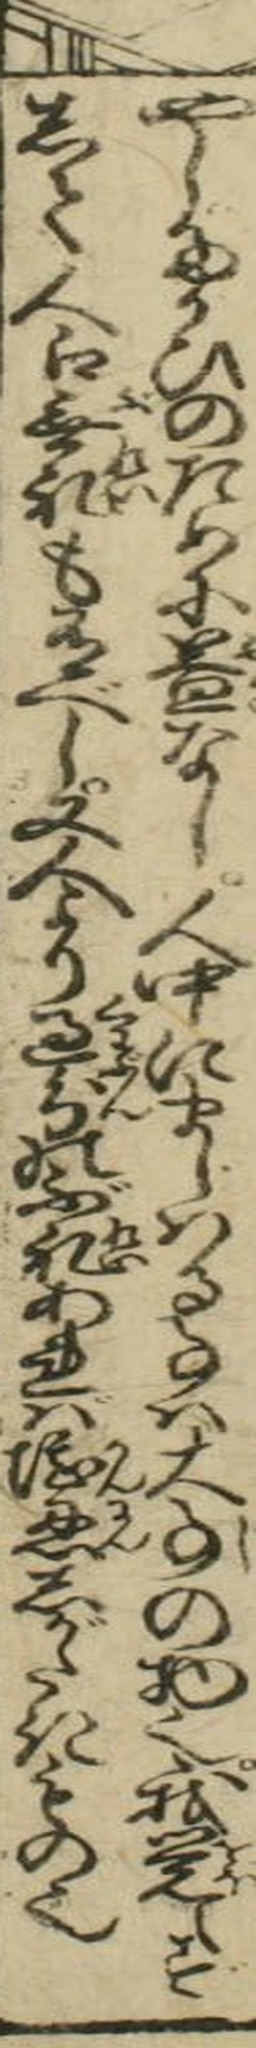して人え無礼も有べし。又人より過分のぶ礼あれば堪忍しがたきもの也
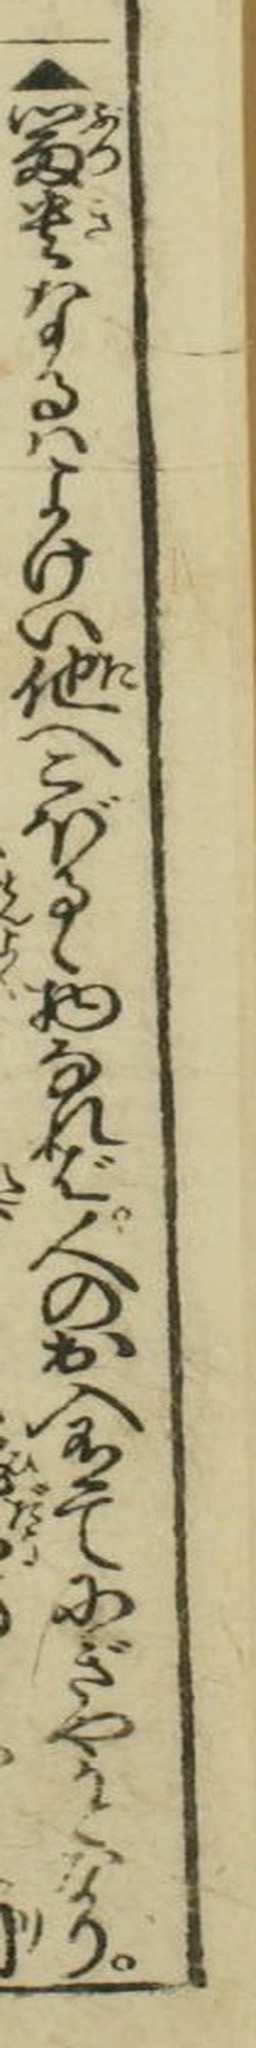▲富貴なるはよけい他へこぼるゝ物なれば。人の出入有てにぎやかとなり。
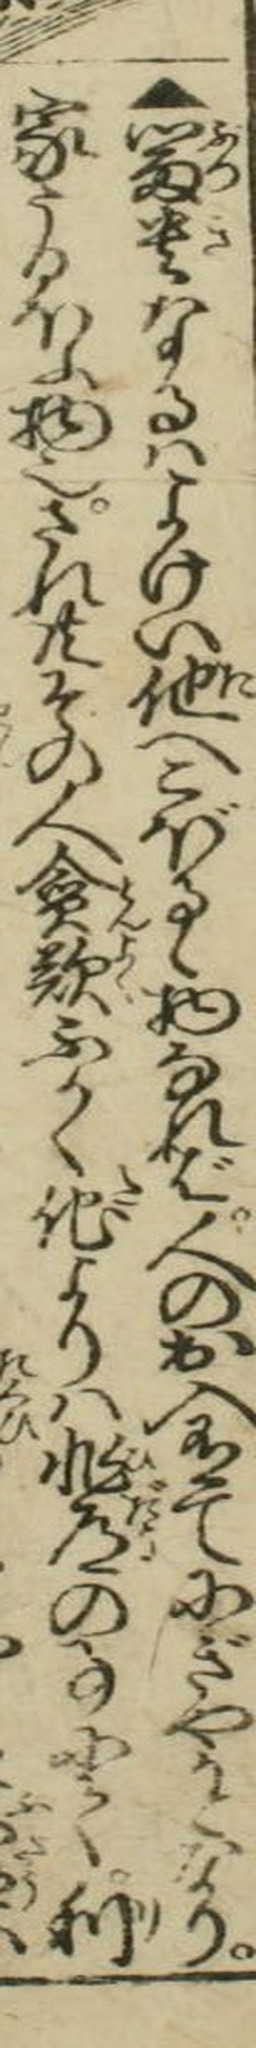家うるほふ物也。され共その人貪欲ふかく他よりは非道の事にて。利
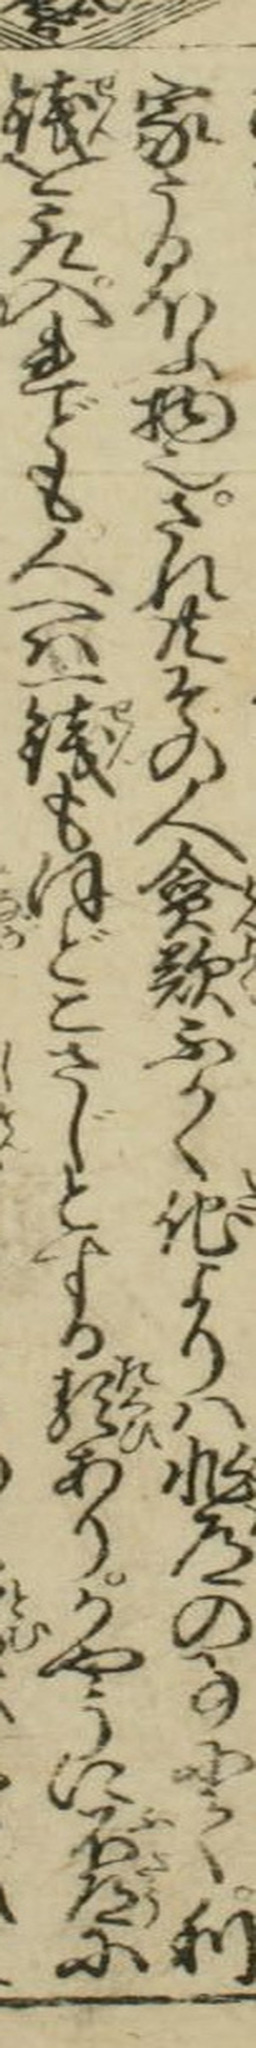錢を取。入れども人へは一錢もほどこさじとする類あり。かやうに不道に
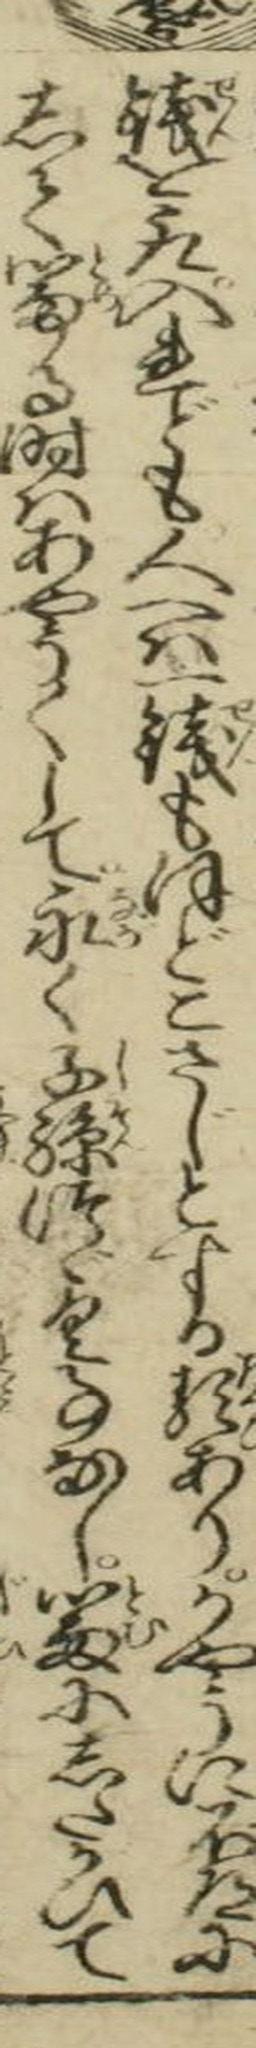して富る時はあやうくして。永く子孫つゞく事なし。富にしたかひて
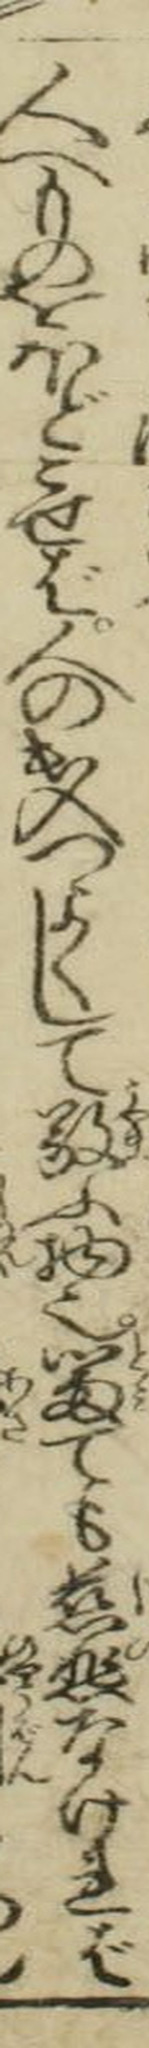人へものをほどこせば。人の出入つよくして敬ふ物也。富ても慈悲なければ
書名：女源氏教訓鑑
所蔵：東京学芸大学附属図書館
